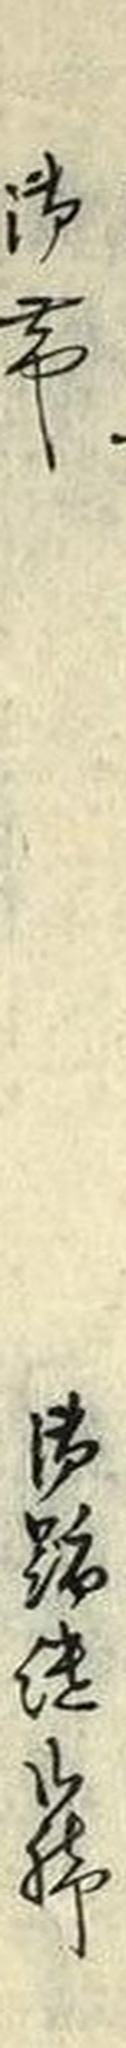御帯御踏継弐脚
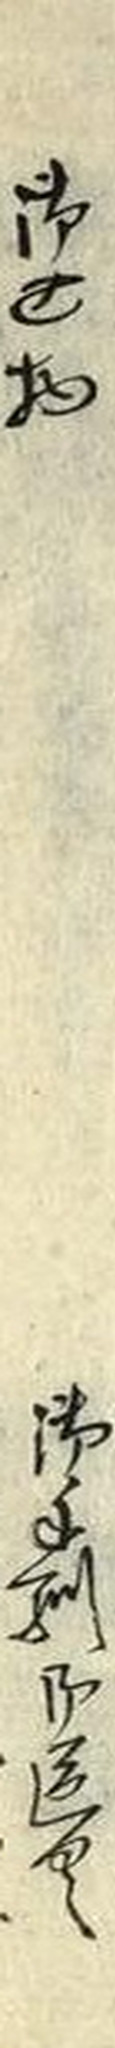御込物御手馴御道具
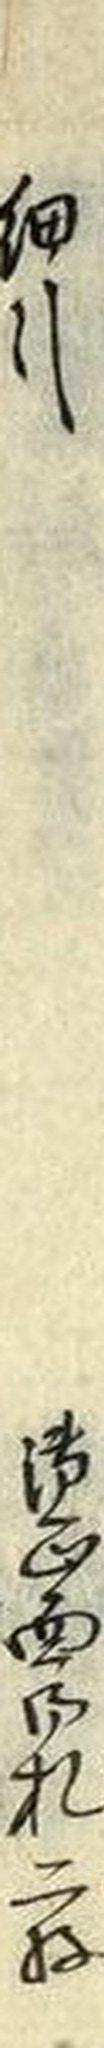細引御正面御札二枚
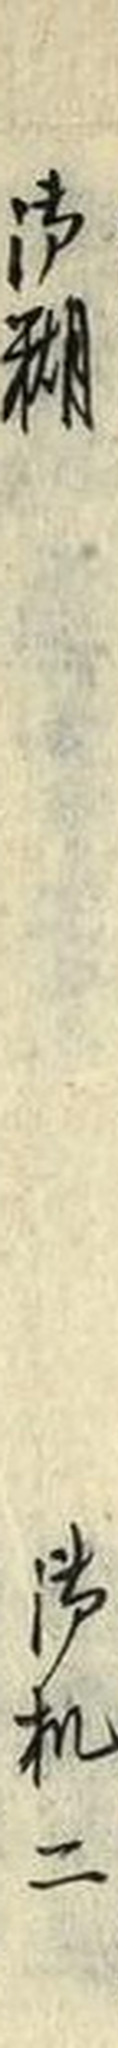御糊御机二

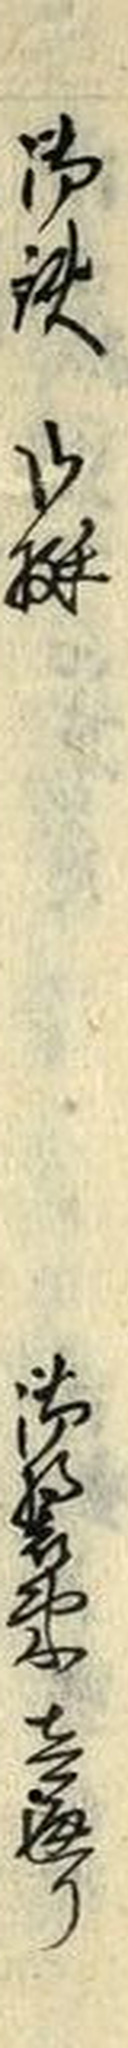御鋏弐挺御装束壱通り
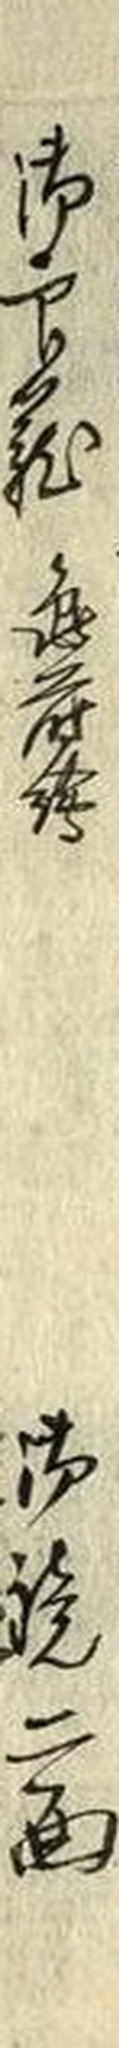御印籠亀蒔絵御鏡二面
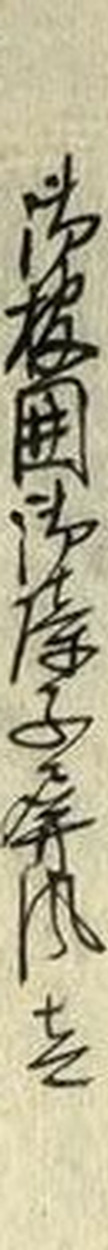御棺囲御障子屏風壱
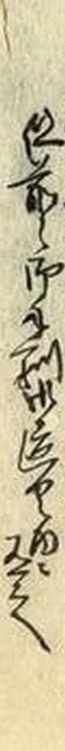但前々御手馴御道具内ニ有之
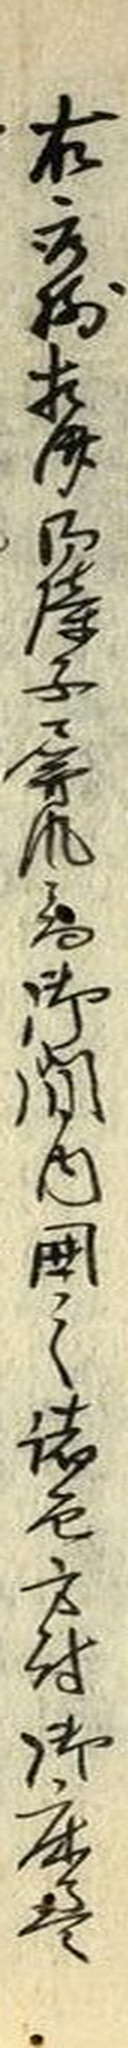右取揃相済御障子屏風ニ而御間内囲之諸色方付御床畳
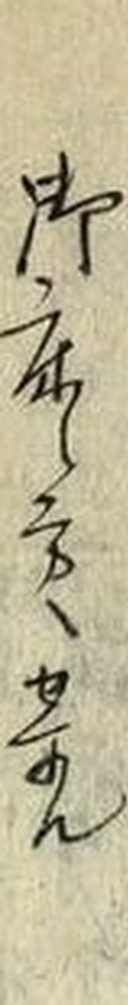御床之方へ寄ル
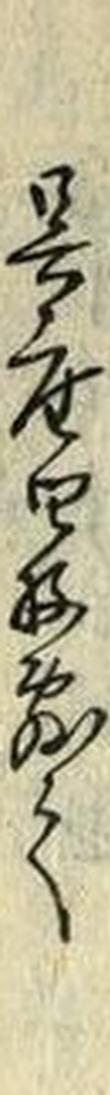呉座四枚敷之
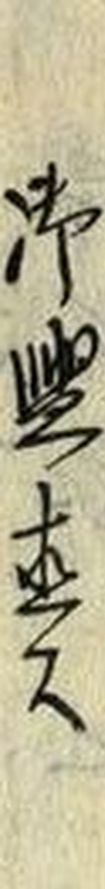御盥直ス
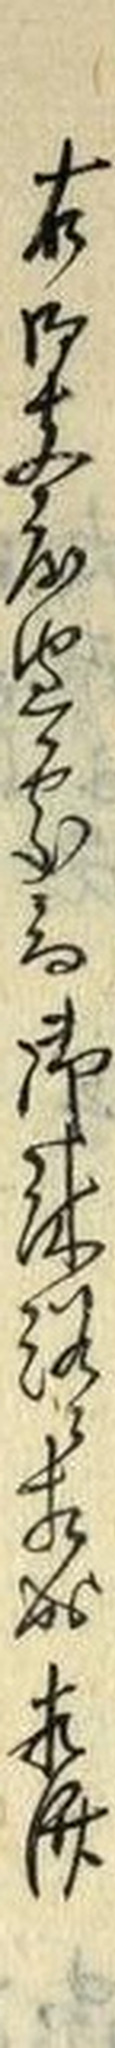右御支度宜候処ニ而御沐浴ニ相成相済
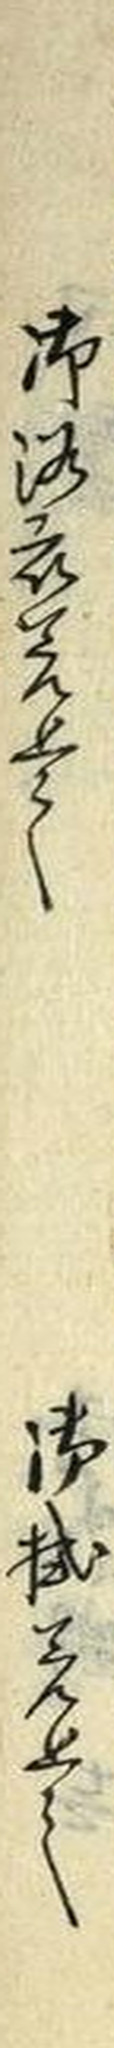御浴衣差上之御拭差上之
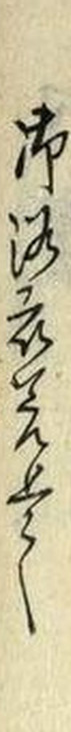御櫛差上之
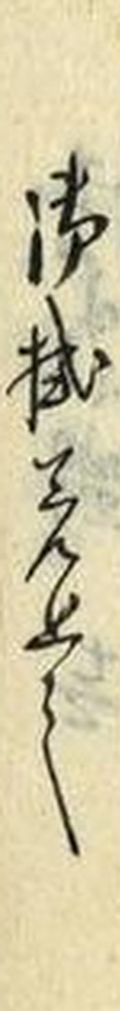御櫛差上之
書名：少傅日録抄（斉善付側向頭取日記、江戸并道中、初入在国、逝去後…
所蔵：福井県文書館 Fukui Prefectural Archives
